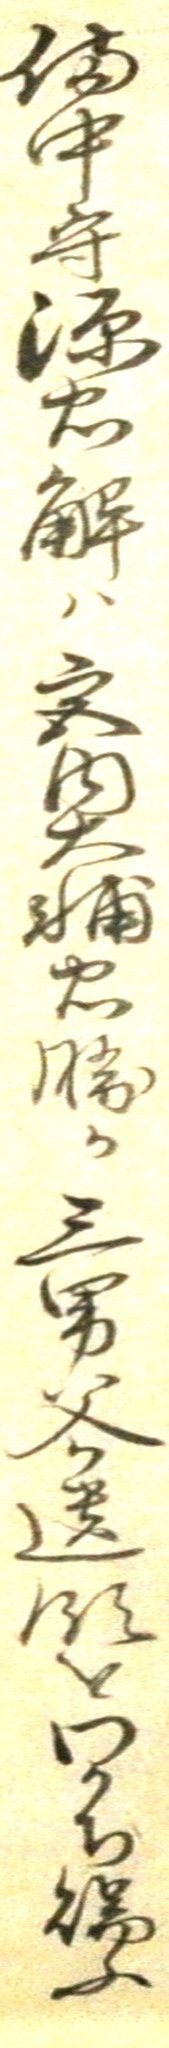備中守源忠解は宮内大輔忠勝か三男父か遺領をわかち賜ふ
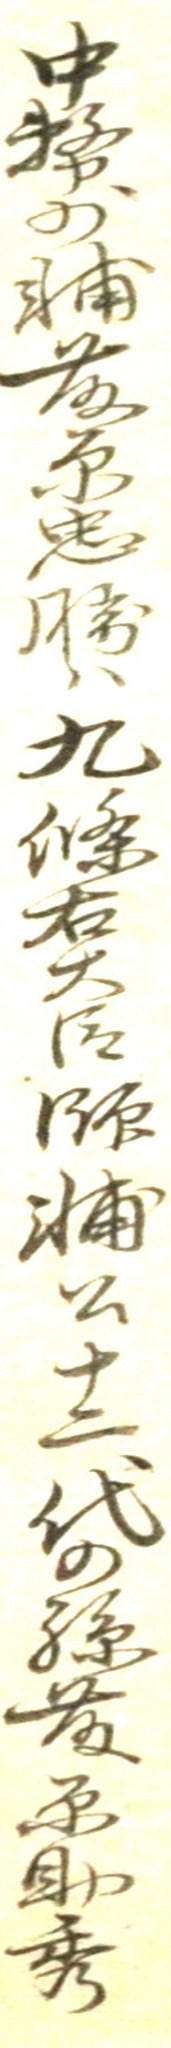中務少輔藤原忠勝は九条右大臣師輔公十二代の孫藤原助秀
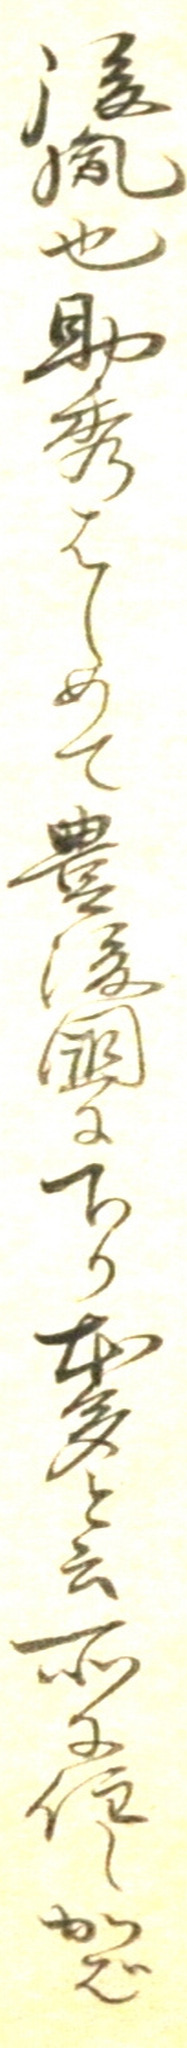後胤也助秀はしめて豊後国に下り本多と云所に住しかば
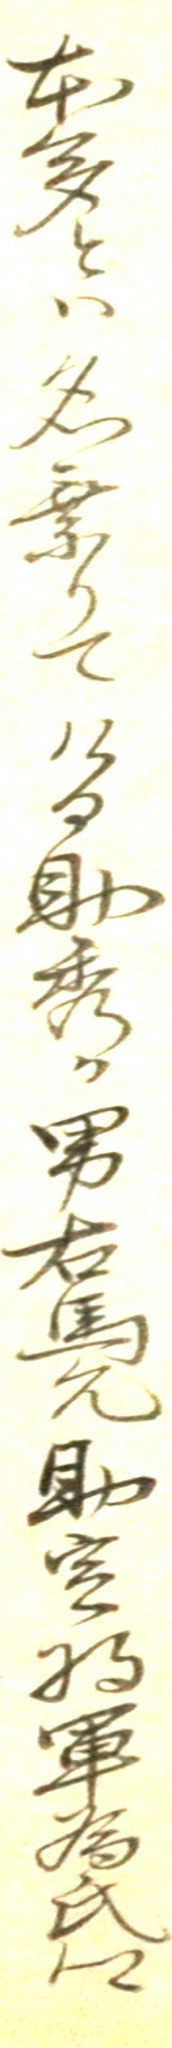本多とは名乗りてける助秀か男右馬允助定将軍為氏卿
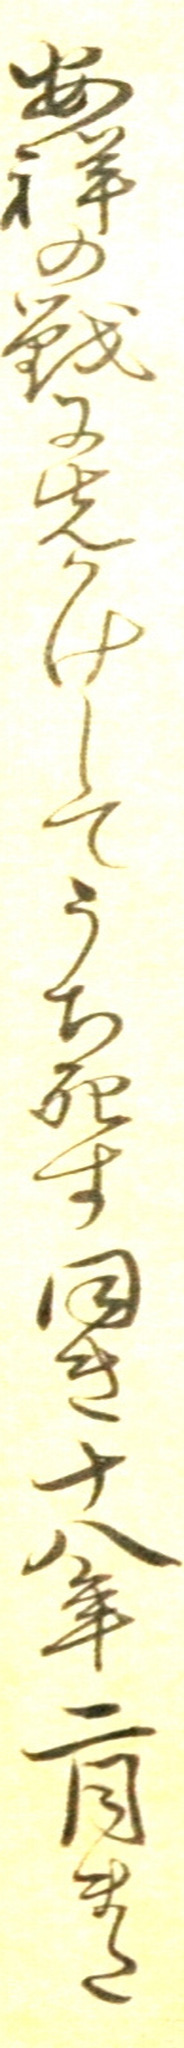安祥の戦に先かけしてうち死す同き十八年二月また

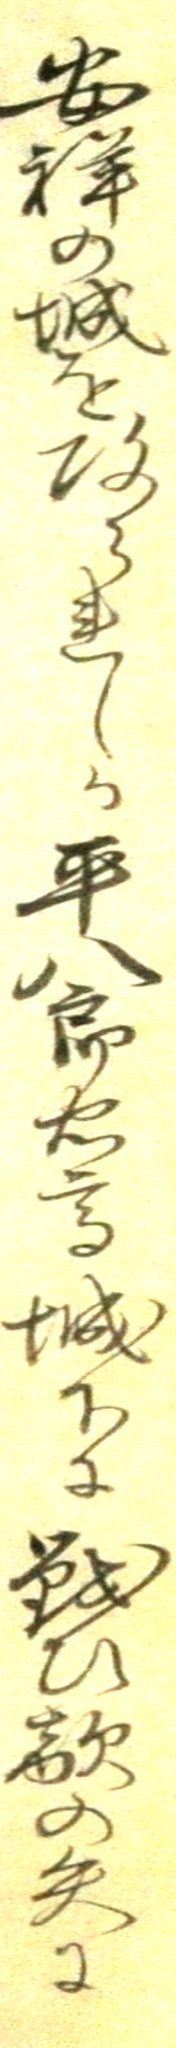安祥の城を攻られしか平八郎忠高城下に戦ひ敵の矢に
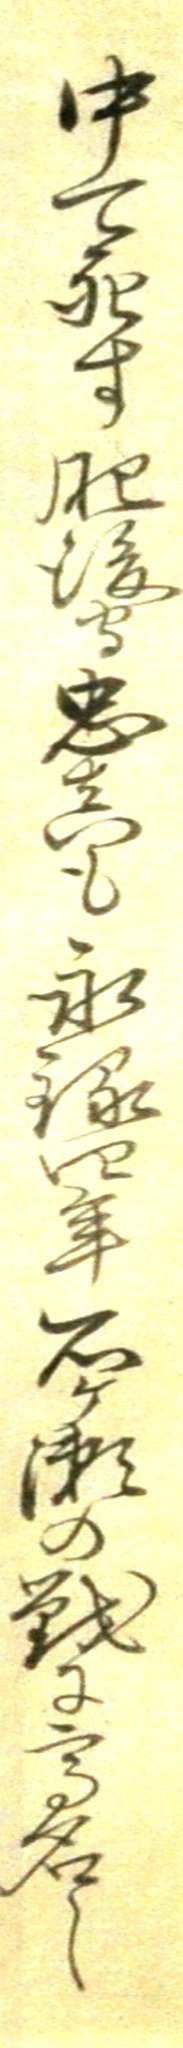中て死す肥後守忠真も永禄四年石ヶ瀬の戦に高名し
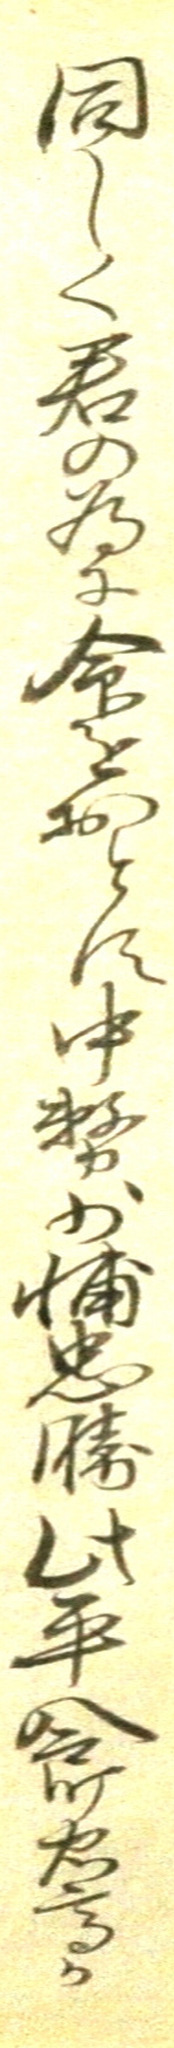同しく君の為に命をおとす中務少輔忠勝此平八郎忠高か
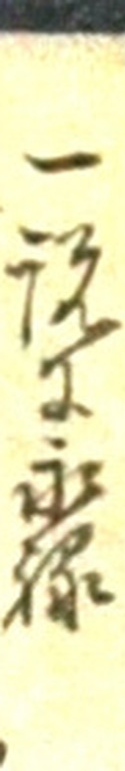一説に永禄
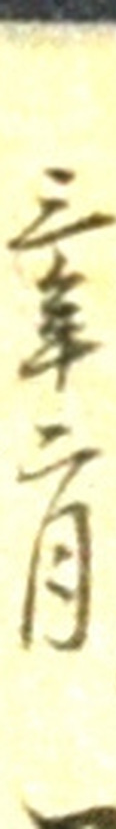三年二月
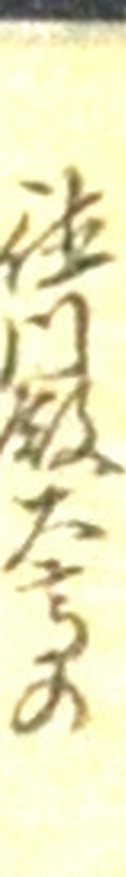徳川殿大高の
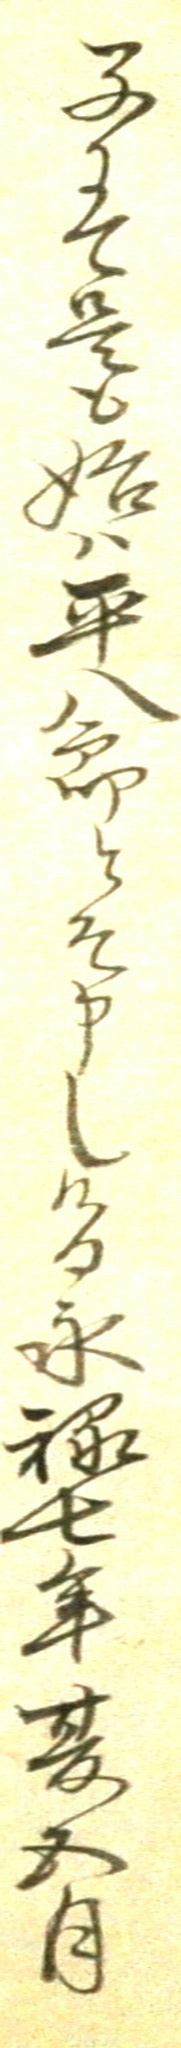子にて是も始は平八郎とそ申しける永禄七年夏五月
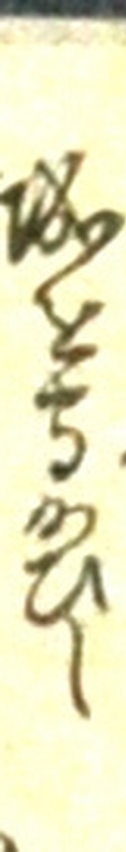城を守給ひし
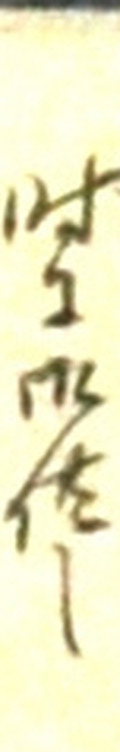時に御佐し
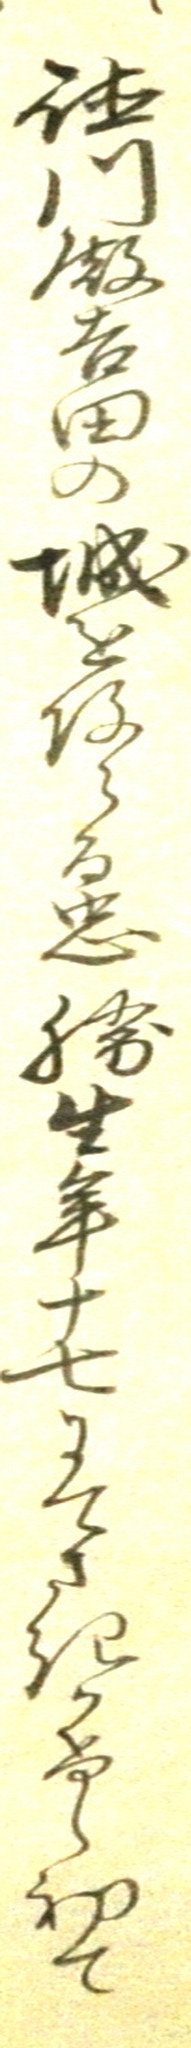徳川殿吉田の城を攻らる忠勝生年十七にてさきかけし初て
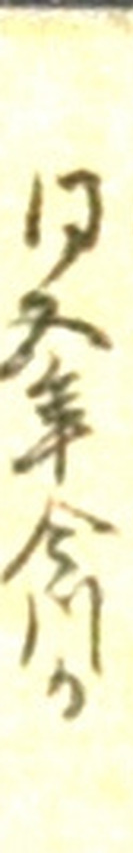同五年今川か
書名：藩翰譜（四・上）
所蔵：伊那市立高遠町図書館・合同会社AMANE
